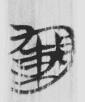軍
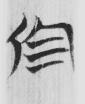於
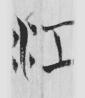江
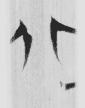北
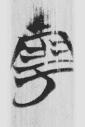𩁹
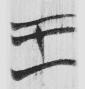王
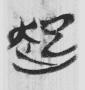起
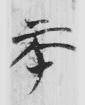帀
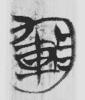軍
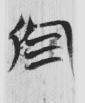於
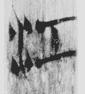江
